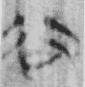谷（欲）
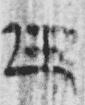任
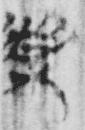樂
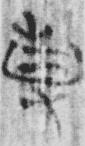事
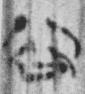谷（欲）
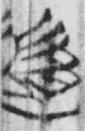後
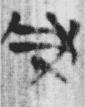凡
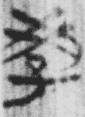○（教）
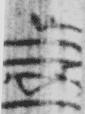者
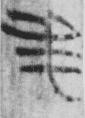求
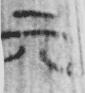亓（其）
